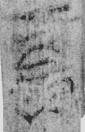豊（禮）
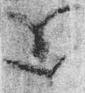內
